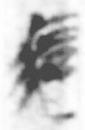驂
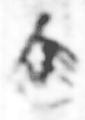哀
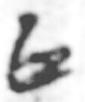臣
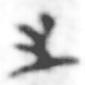之
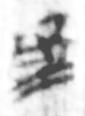爲
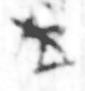○（左）
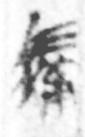○（服）
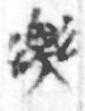樂
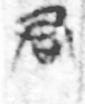君
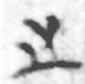之
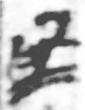爲
